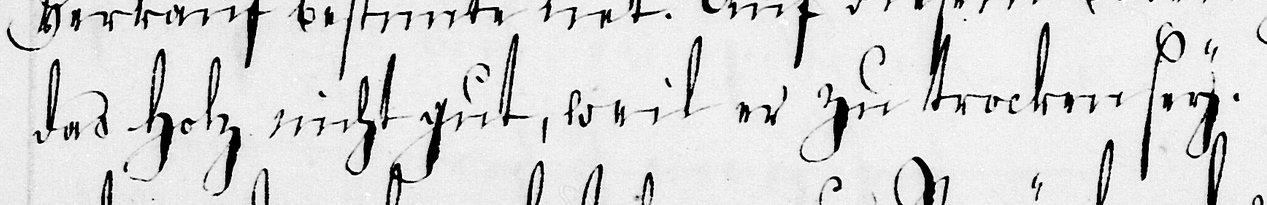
das Holz nicht gut, weil er zu trocken sey.
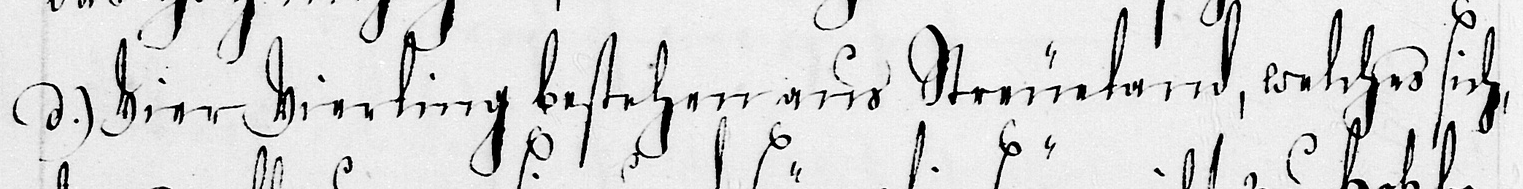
d.) Vier Vierling bestehen aus Streueland, welches sic¬
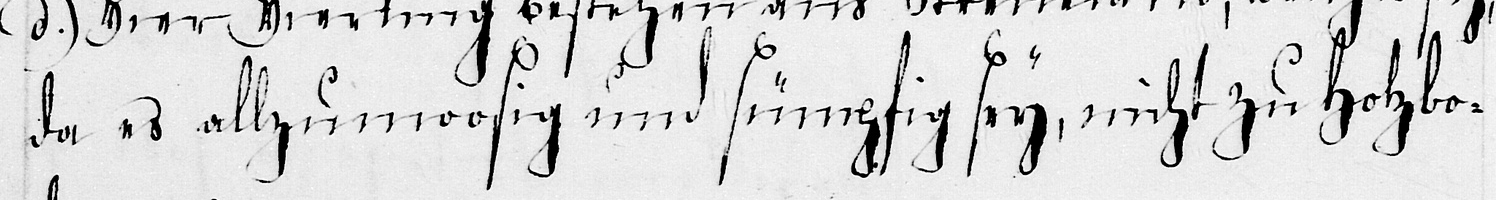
da es allzu moosig und sümpfig sey, nicht zu Holzbo¬
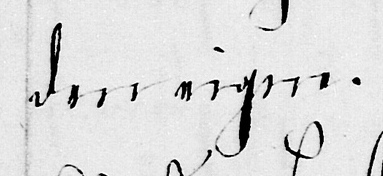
den eigne.
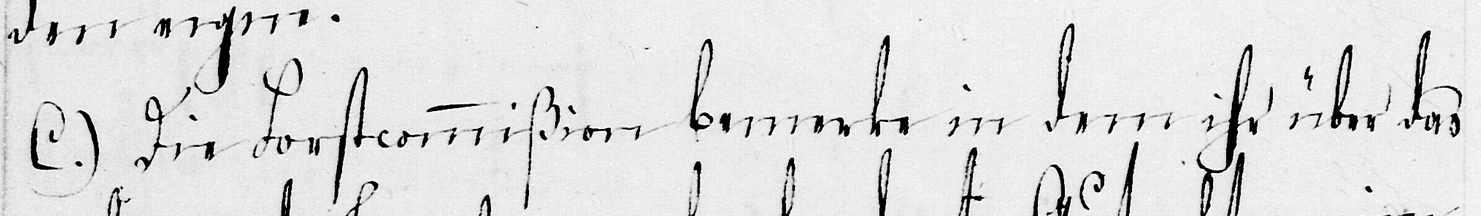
C.) Die Forstcommißion bemerke in dem ihr über das
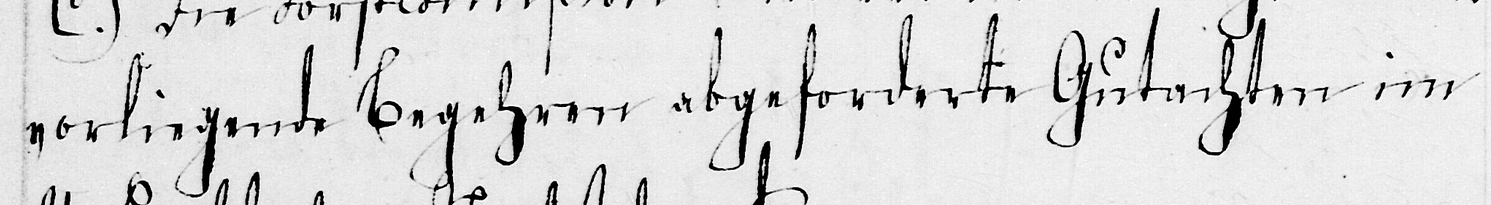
vorliegende Begehren abgeforderte Gutachten im
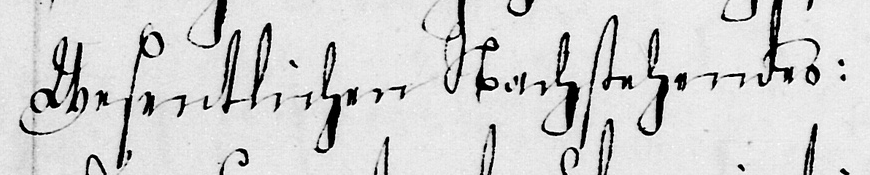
Wesentlichen Nachstehendes:
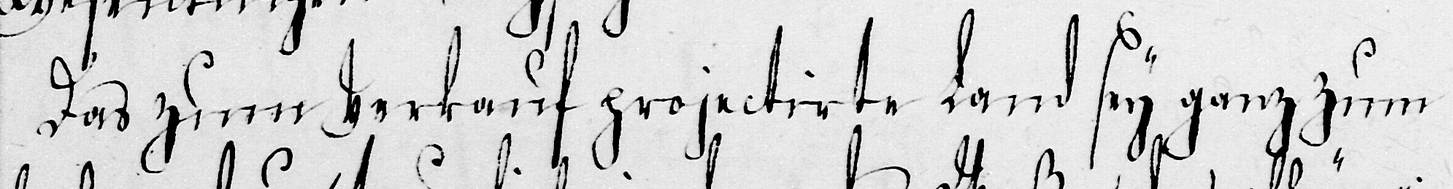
Das zum Verkauf projectirte Land sey ganz zum
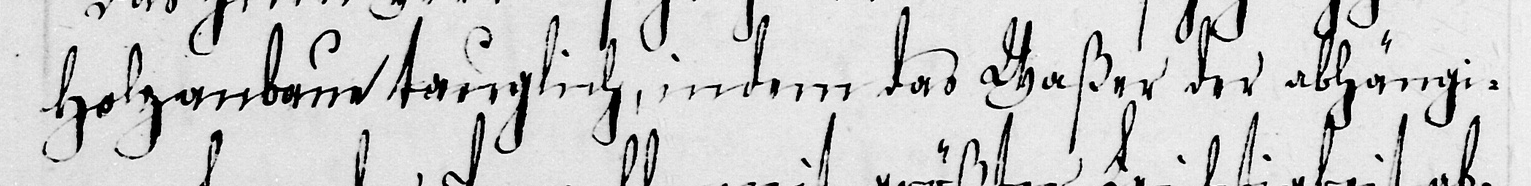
Holzanbau tauglich, indem das Waßer der abhängi¬
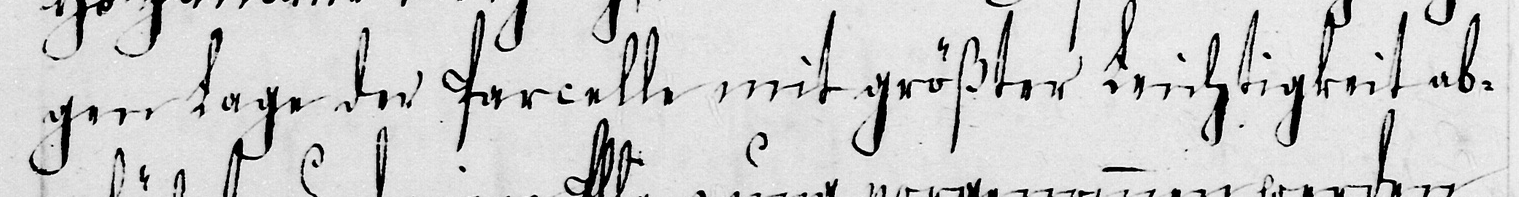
gen Lage der Parcelle mit größter Leichtigkeit ab¬
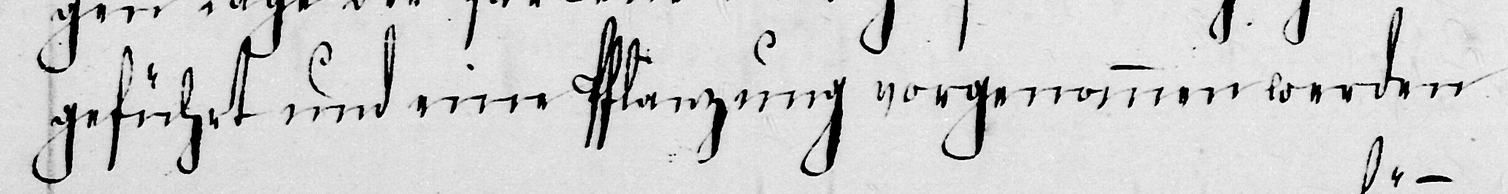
geführt und eine Pflanzung vorgenommen werden
